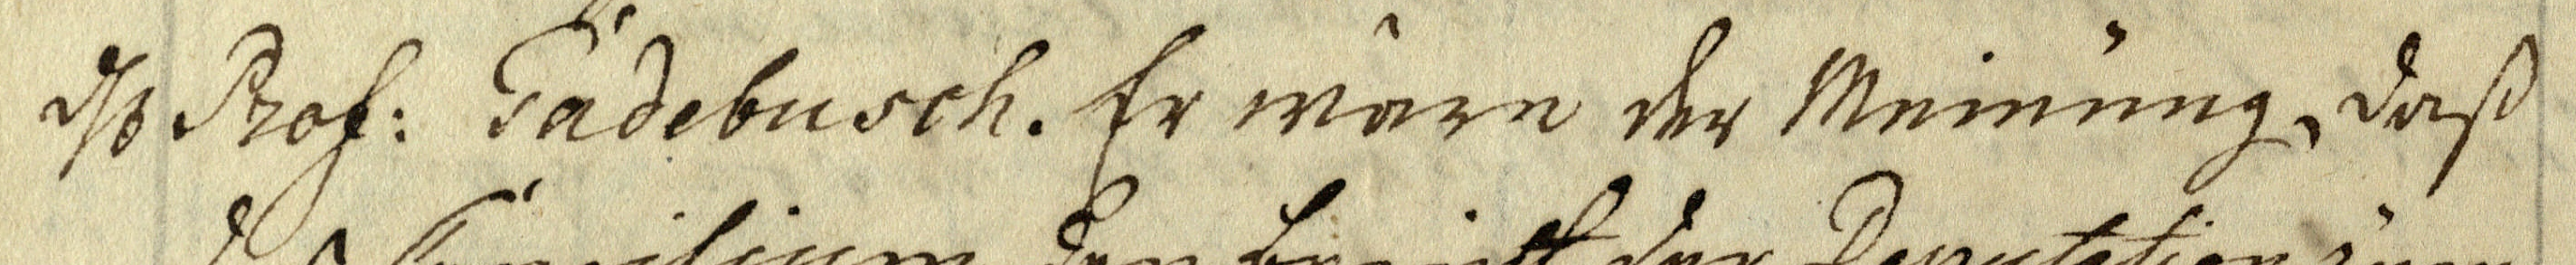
dh Prof: Gadebusch. Er wäre der Meinung, daß
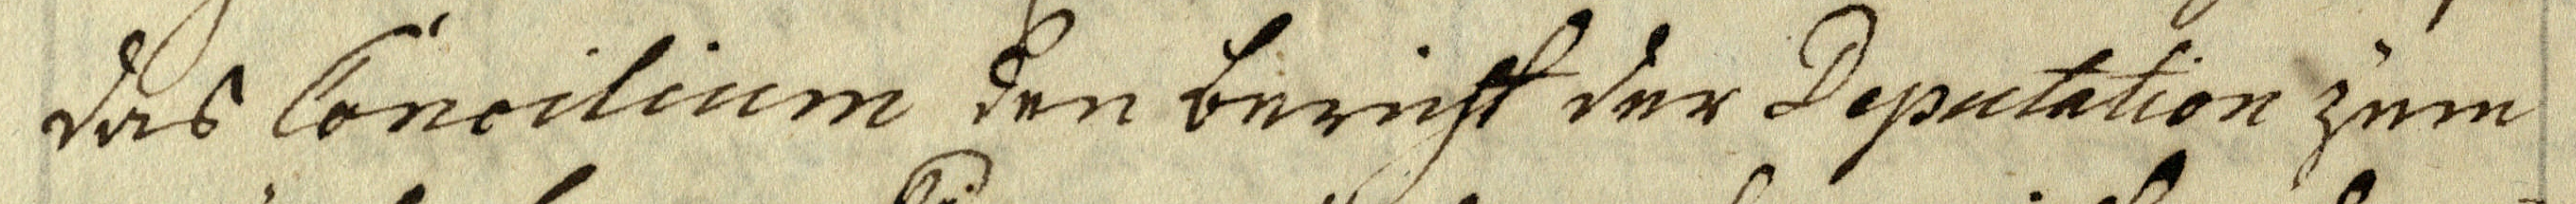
das Concilium den Bericht der Deputation zum
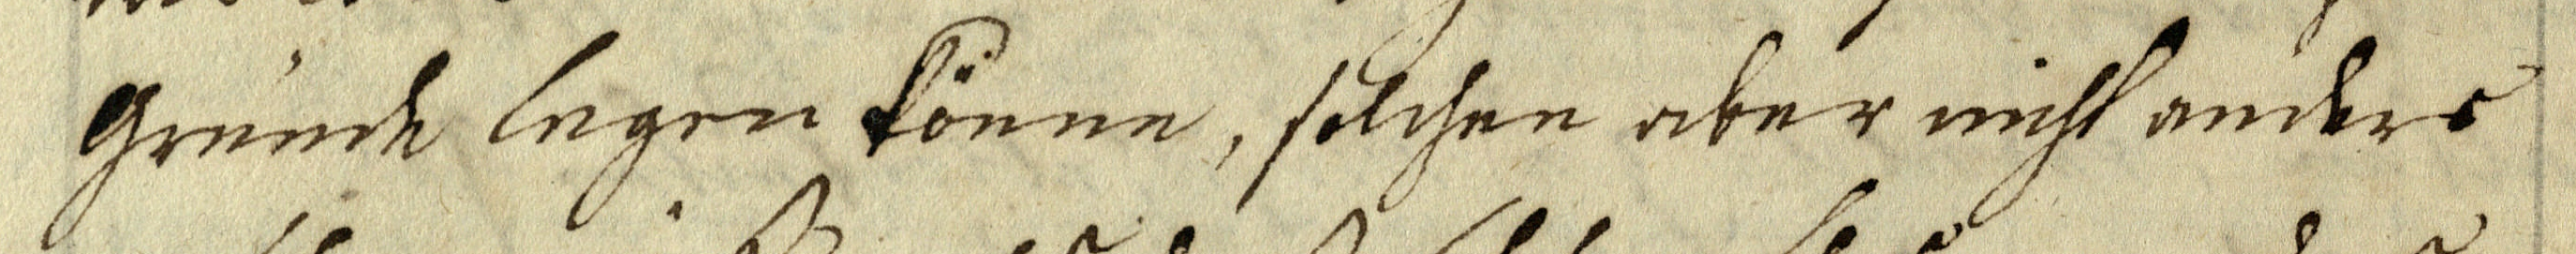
Grunde legen könne, solchen aber nicht anders
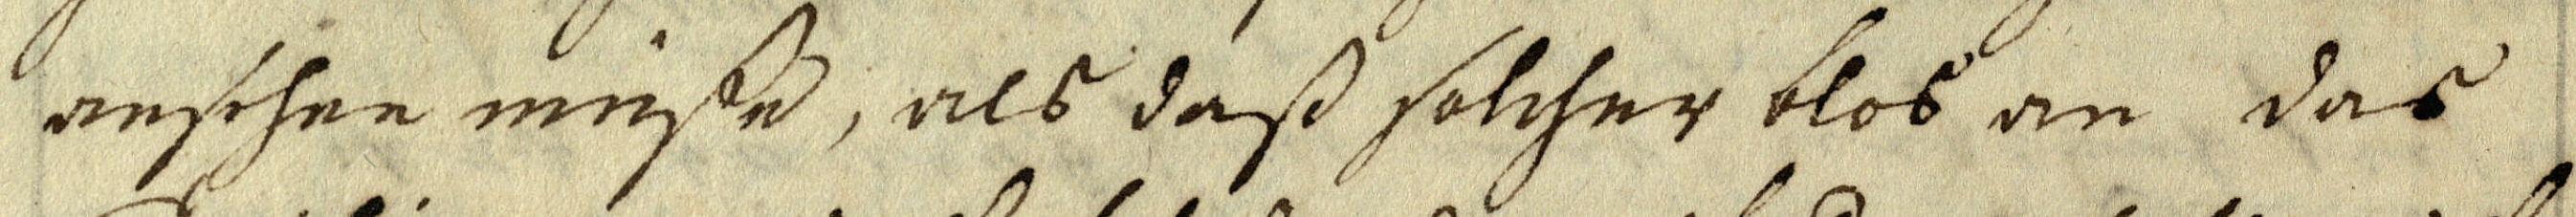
ansehen müße, als daß solcher blos an das
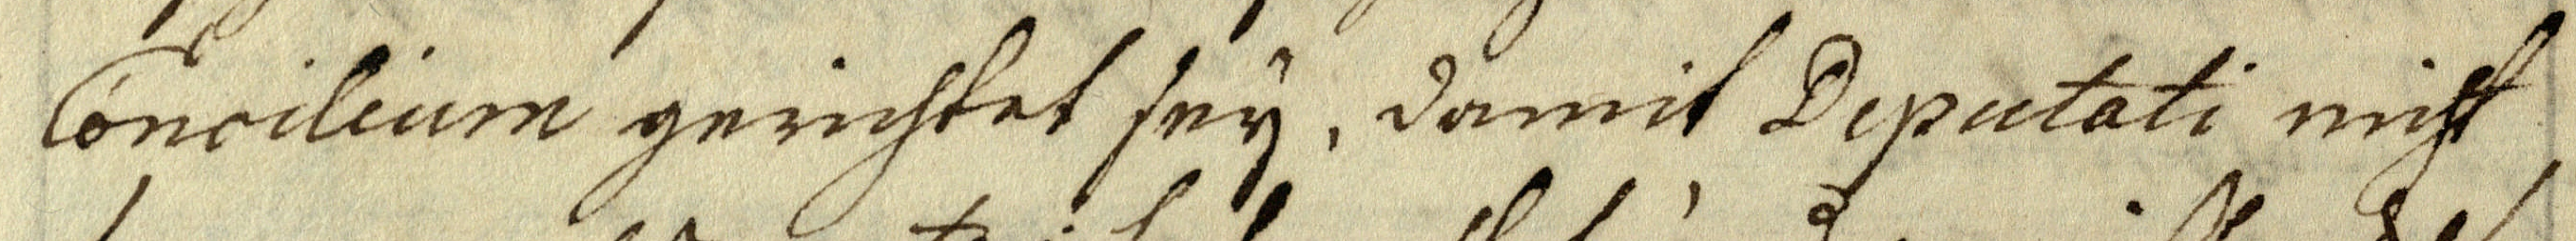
Concilium gerichtet seÿ, damit Deputati nicht
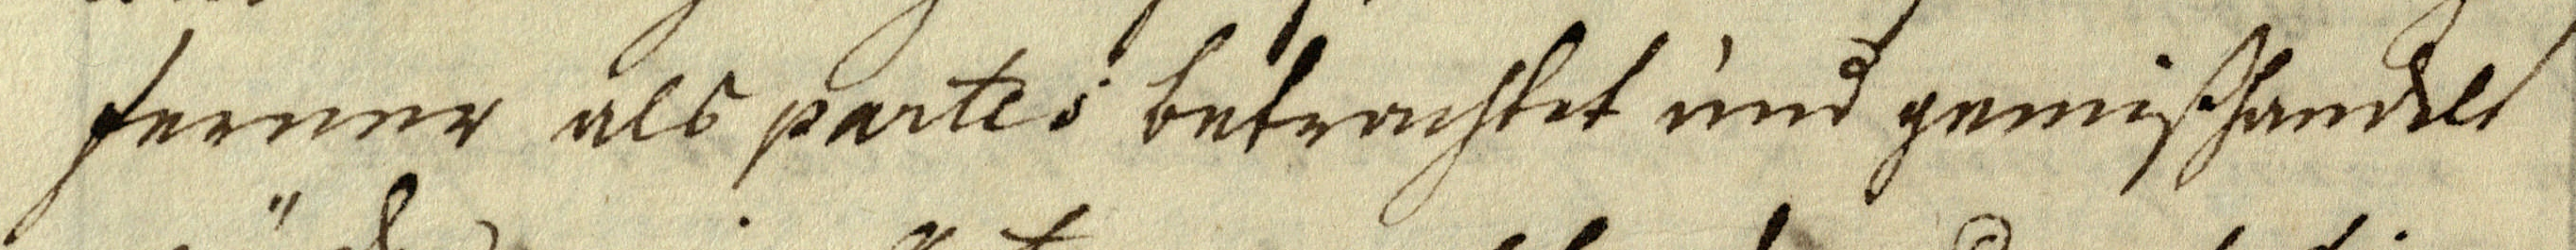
ferner als partes betrachtet und gemißhandelt
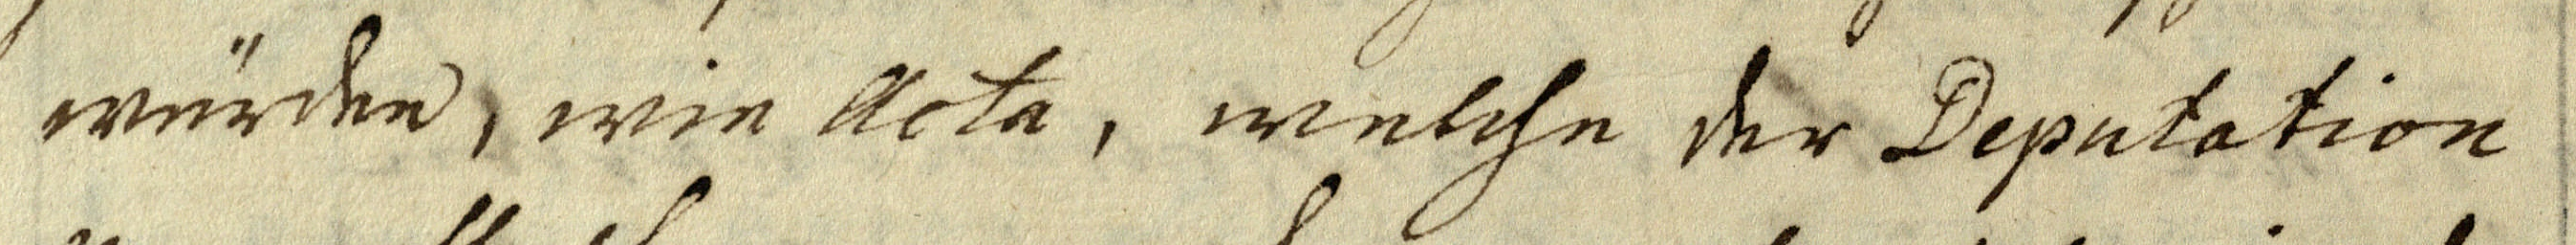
würden, wie Acta, welche der Deputation
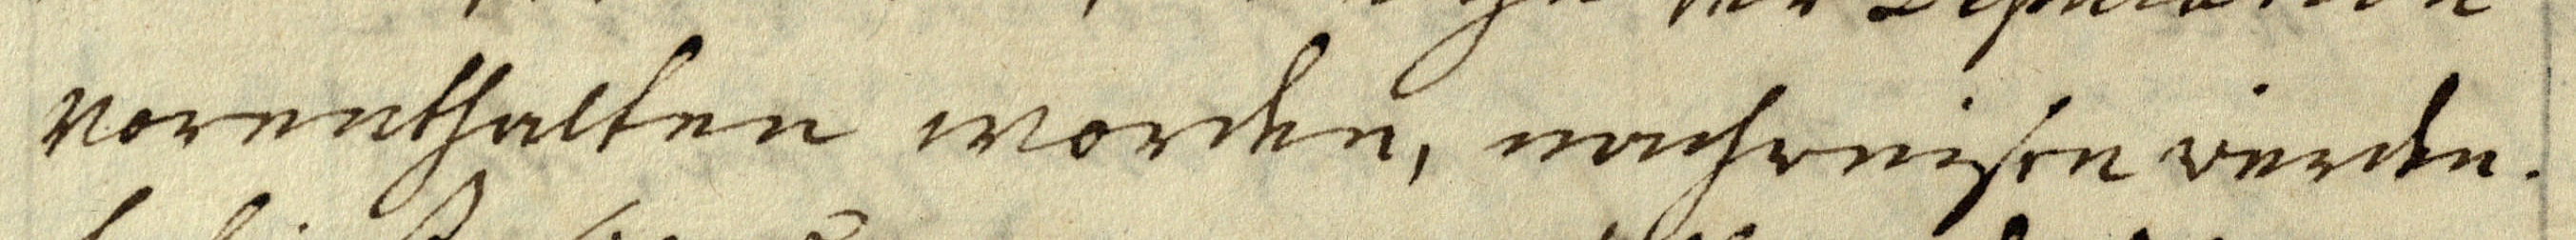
vorenthalten worden, nachweisen würden.
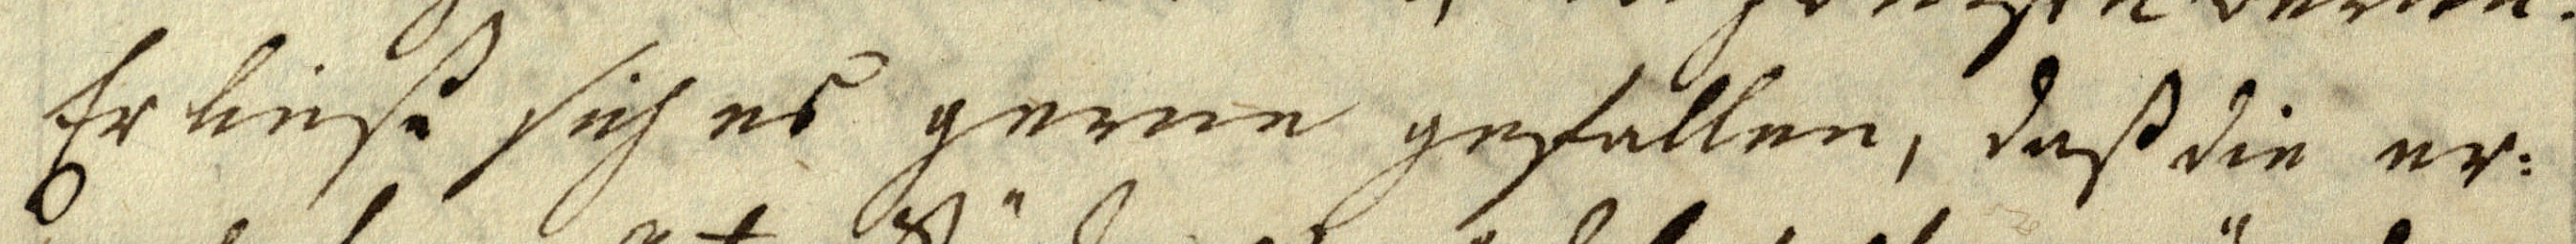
Er ließe sich es gerne gefallen, daß die er¬
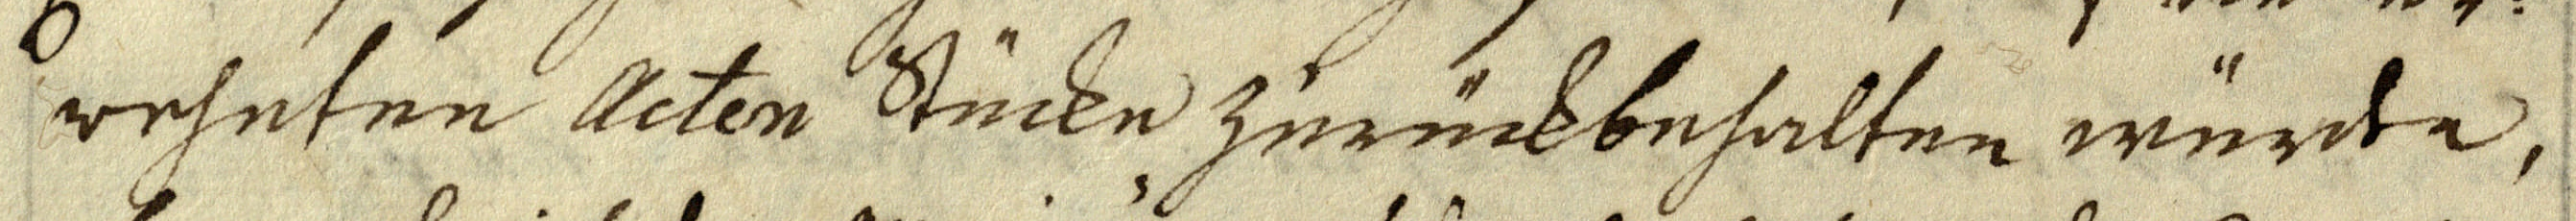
wehnten Acten Stücke zurückbehalten würden,
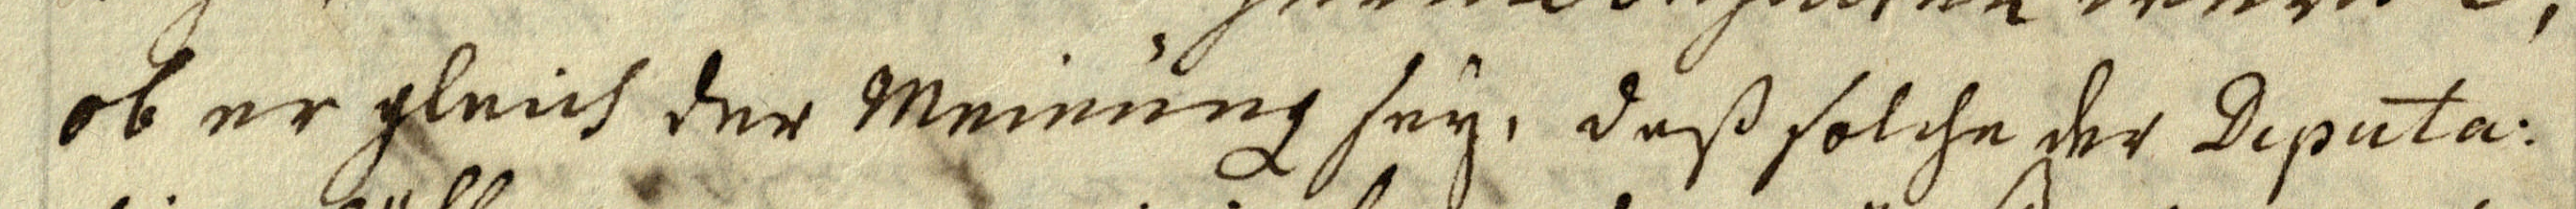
ob er gleich der Meinung seÿ, daß solche der Deputa¬
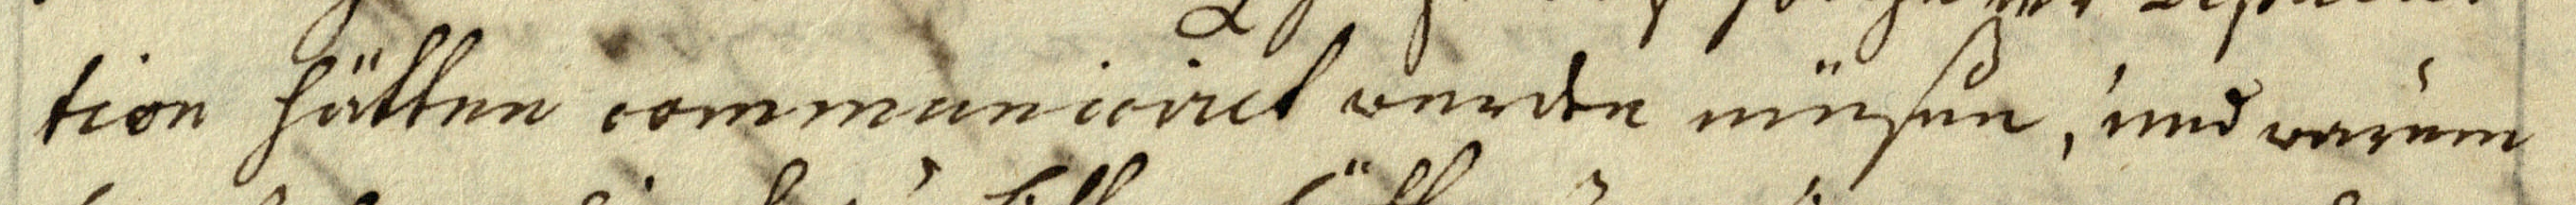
tion hätten communicieret werden müßen, und warum
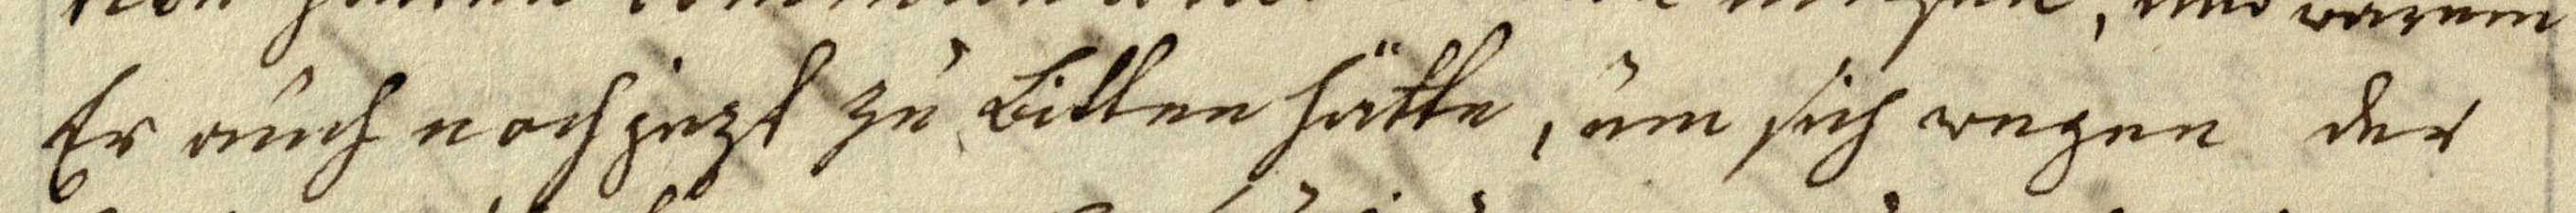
Er auch noch jezt zu bitten hätte, um sich wegen der
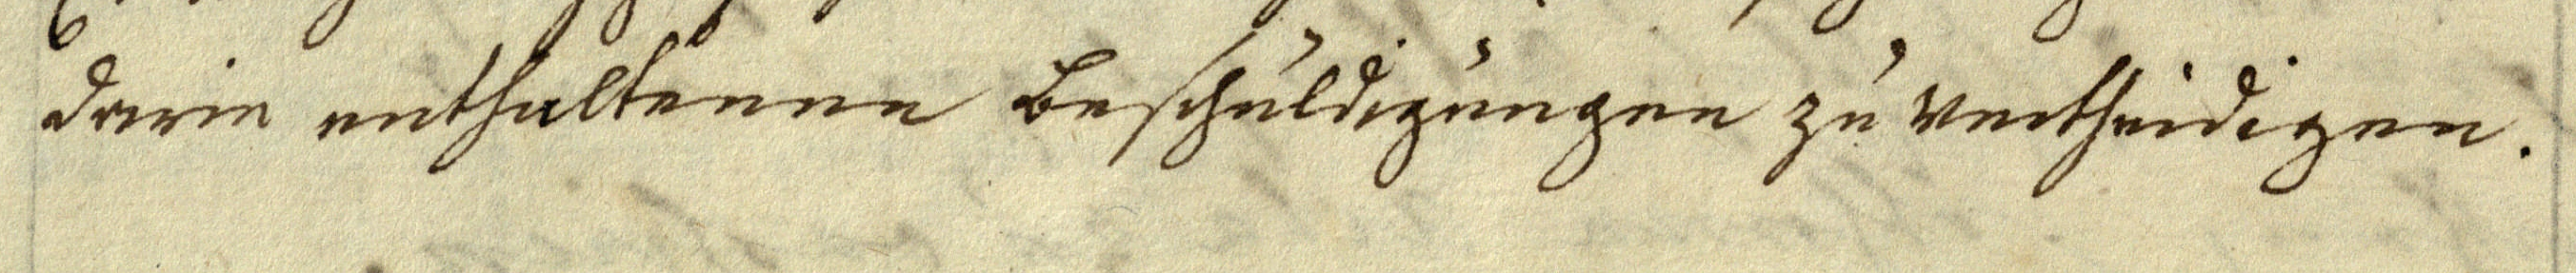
darin enthaltenen Beschuldigungen zu vertheidigen.
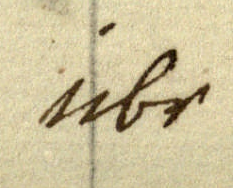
übr.
